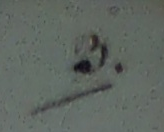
3.
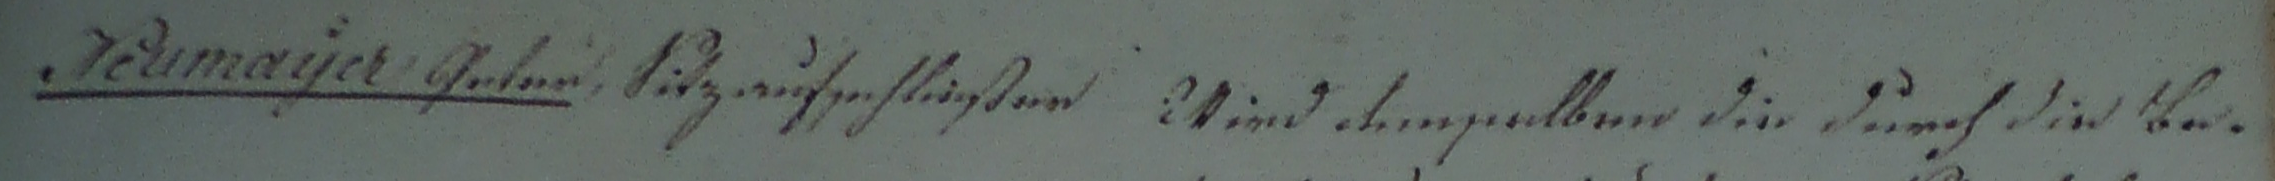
Neumayer Peter, Sitzaufschließer Wird demselben die durch die Be¬
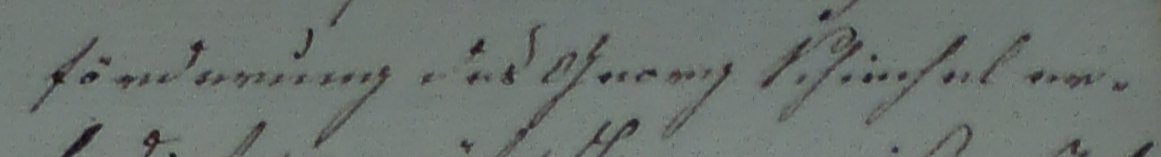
förderung des Georg Schiechel er¬
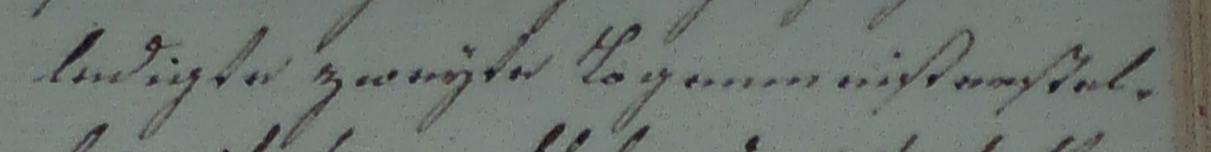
ledigte zweyte Logenmeisterstel¬
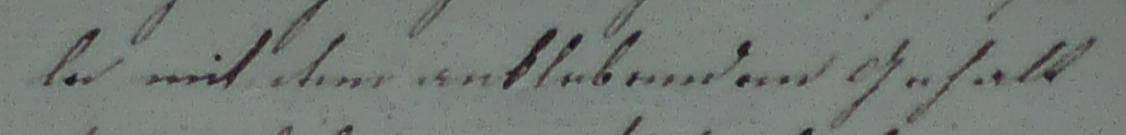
le mit dem anklebendem Gehalt
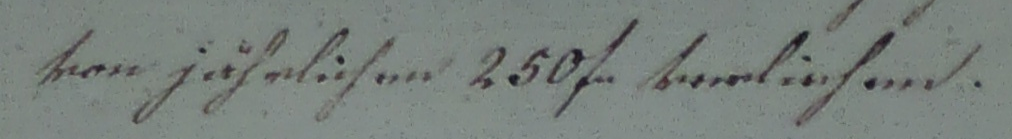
von jährlichen 250fn verliehen.
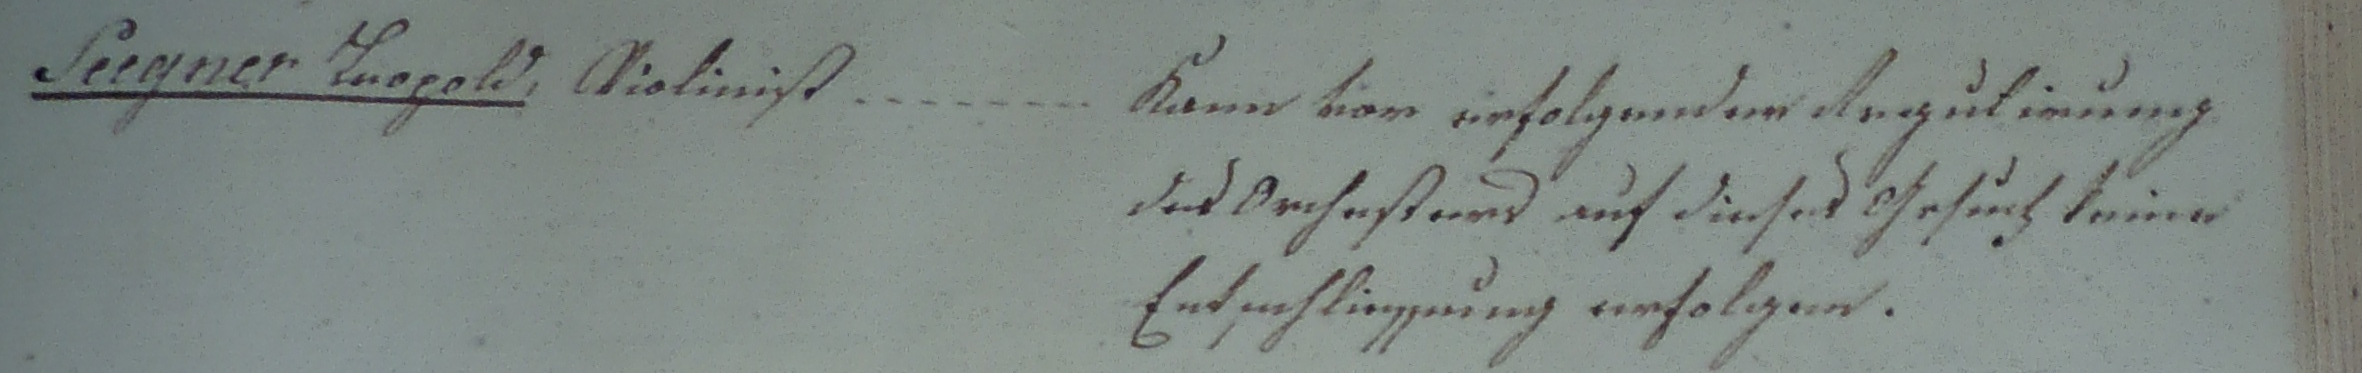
Seegner Leopold, Violinist …….. Kann vor erfolgender Regulirung
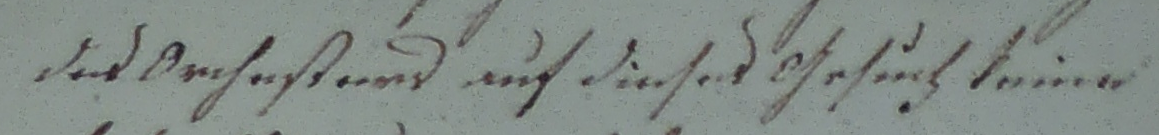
des Orchesters auf dieses Gesuch keine
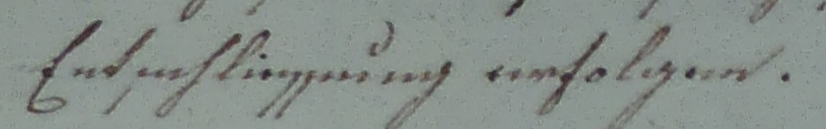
Entschliessung erfolgen.
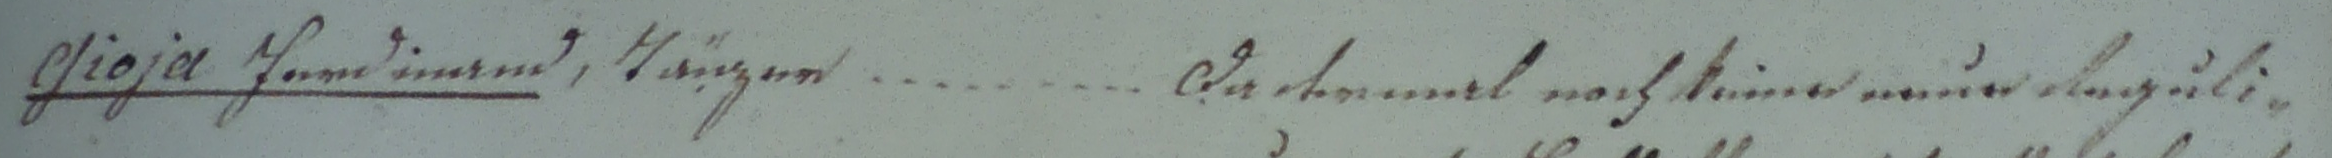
Gioja Ferdinand, Tänzer ……… Da dermal noch keine neue Reguli¬
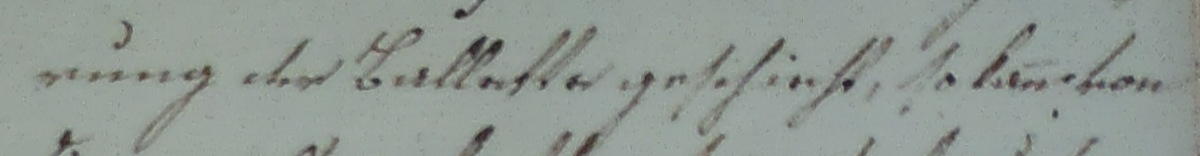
rung der Ballette geschieht, so kan̅ von
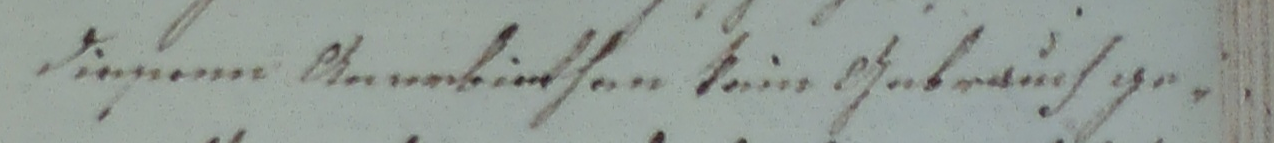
diesem Anerbiethen kein Gebrauch ge¬
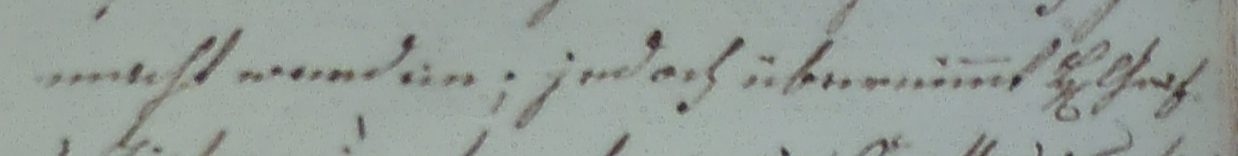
macht werden; jedoch übernim̅t HE Graf
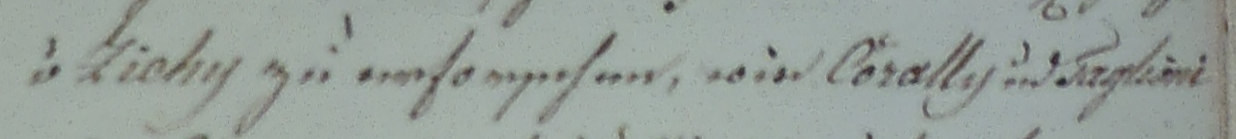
v Zichy zu erforschen, wie Corally und Arglini
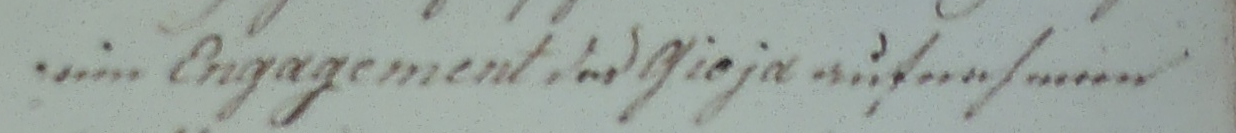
ein Engagement des Gioja auserseen
